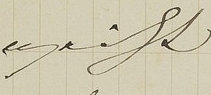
worden ist.
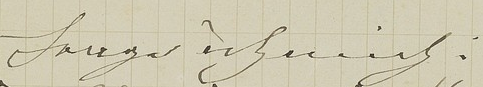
Frage ich mich:
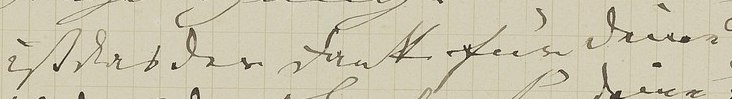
«ist das der Dank für deine
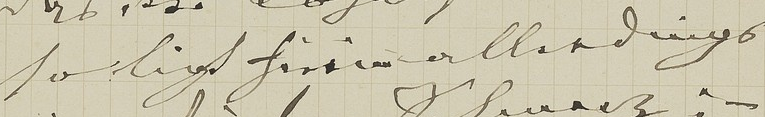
So liegt hierin allerdings
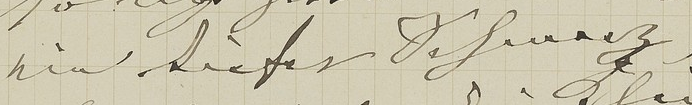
ein tiefer Schmerz;»
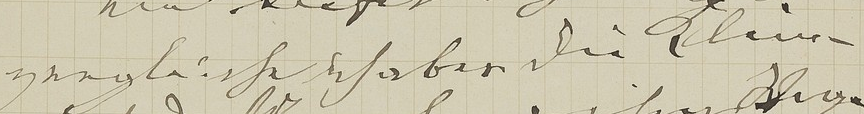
vergleiche ich aber die Klein-
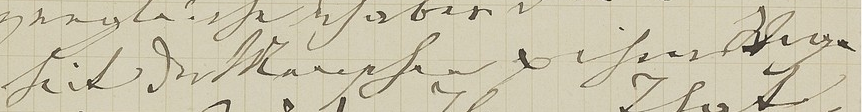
heit der Menschen & ihrer Wege
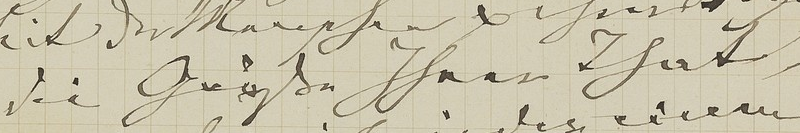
die Größe Ihrer That,
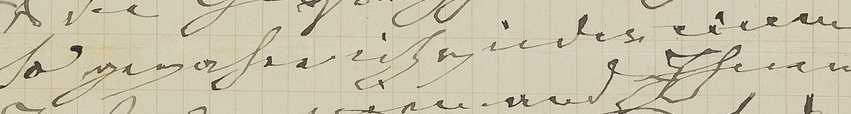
so gewahre ich wieder einen
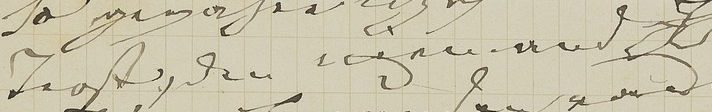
Trost, den niemand Ihnen
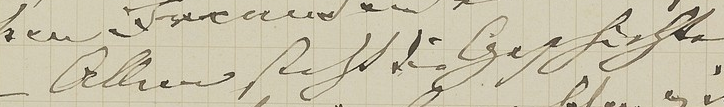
Allem steht die Geschichte
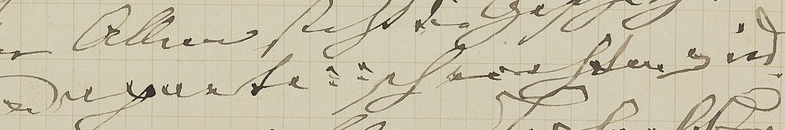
die unparteiisch richten wird.
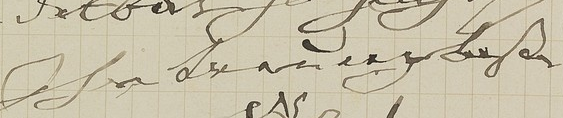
Ihr treu ergebenster
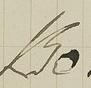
Bern
